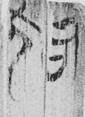狗（耉）
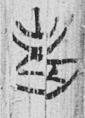老
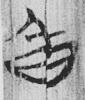昏（問）
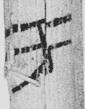于
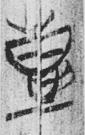彭
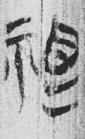祖
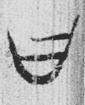曰
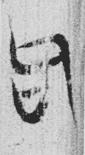句（耉）
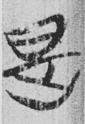是（氏）
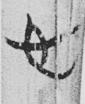心
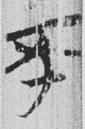不
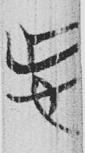忘
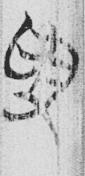受
